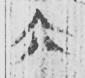六
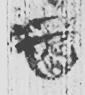百
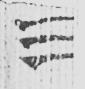三
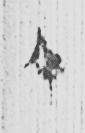千
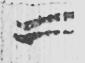二
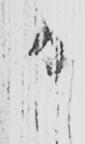千
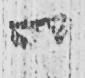四
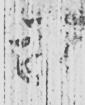百
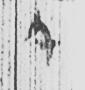千
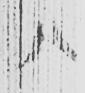八
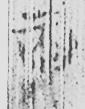百
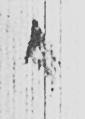千
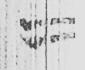二
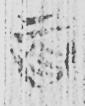百
